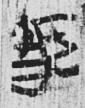○（聞）
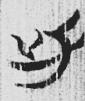此
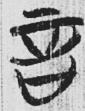言
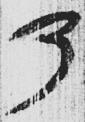乃
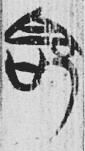命
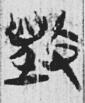毀
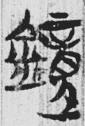鐘
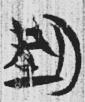型
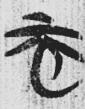而
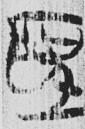聖（聽）
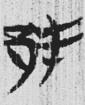邦
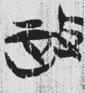政
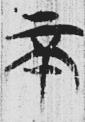不
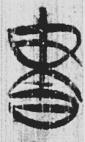晝
